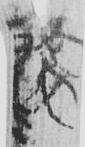流
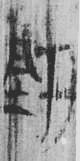型（形）
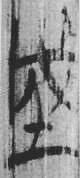城（成）
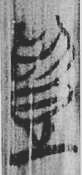豊（體）
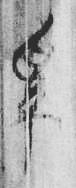○（奚）
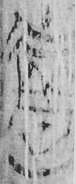○（失）
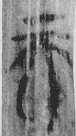而
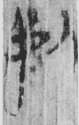死
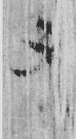又（有）
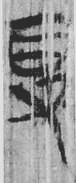○（得）
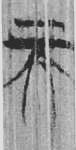而
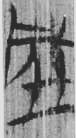城（成）
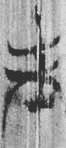未
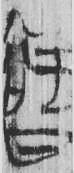智（知）
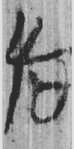左
